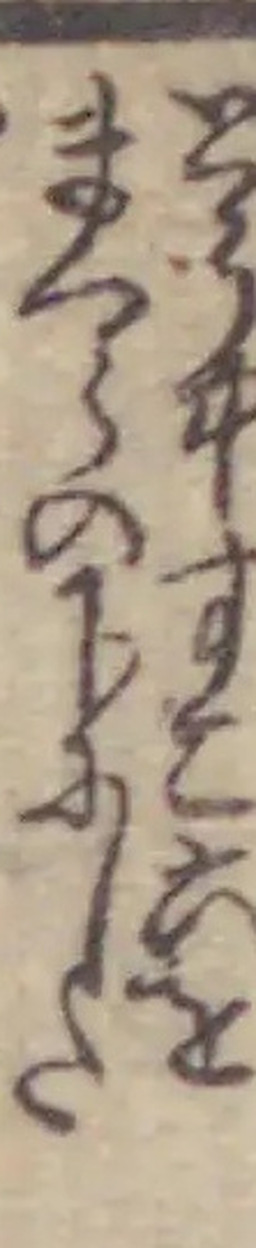まくらの下にした
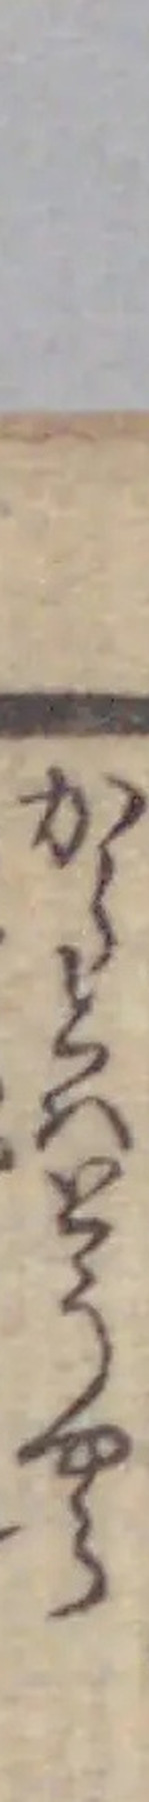からとはとうやら
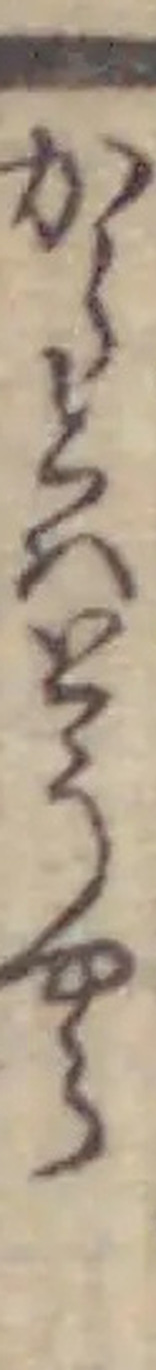からとはとうやら
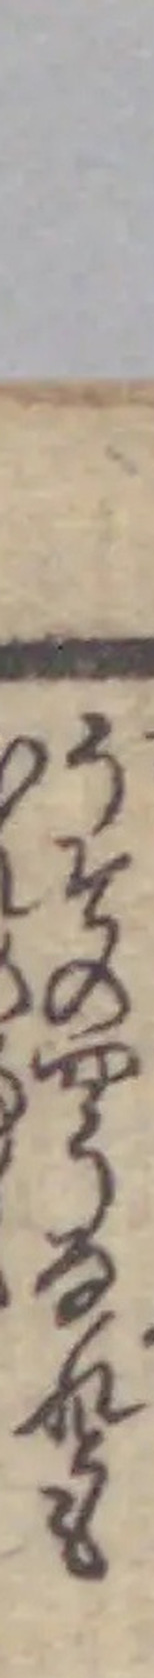うそのやうなれとも
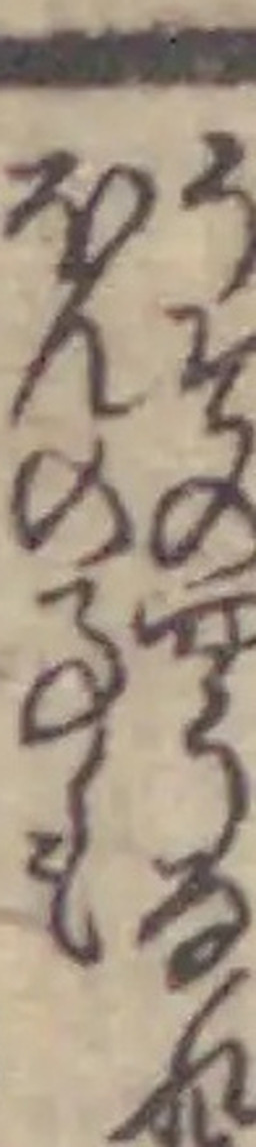ほんの事も
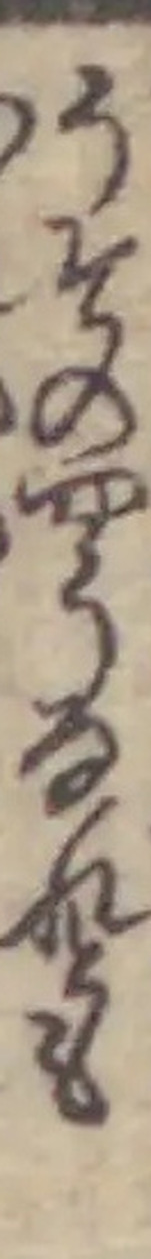うそのやうなれとも
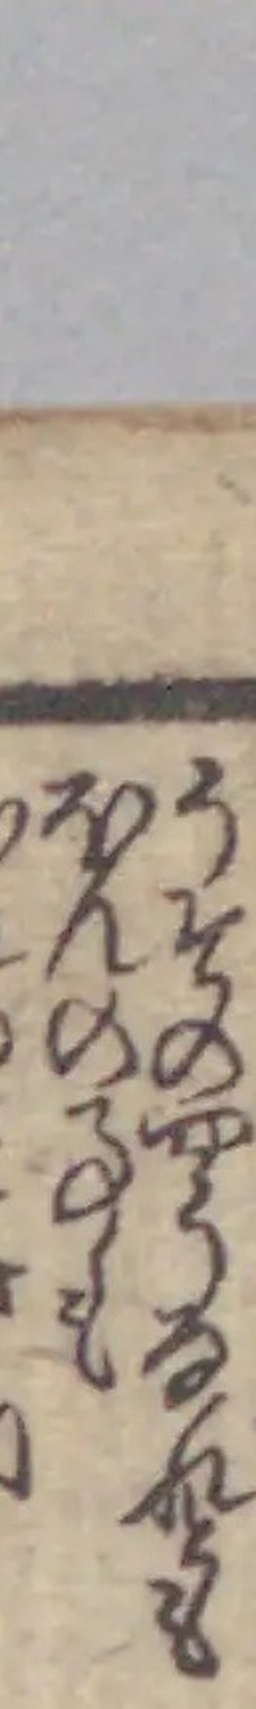ほんの事も
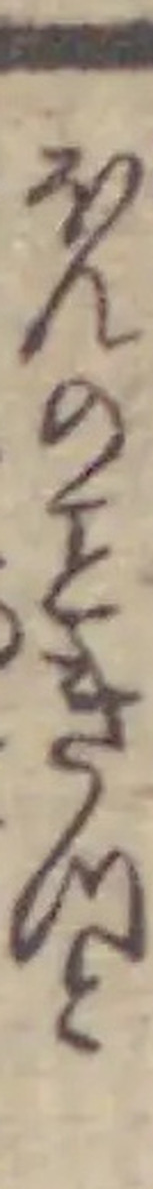ほんのこときつと
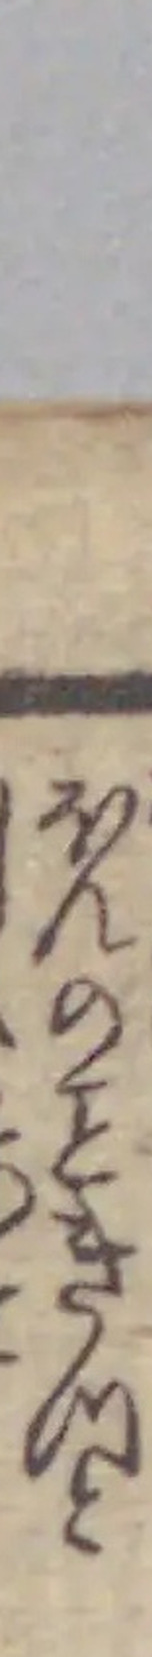ほんのこときつと
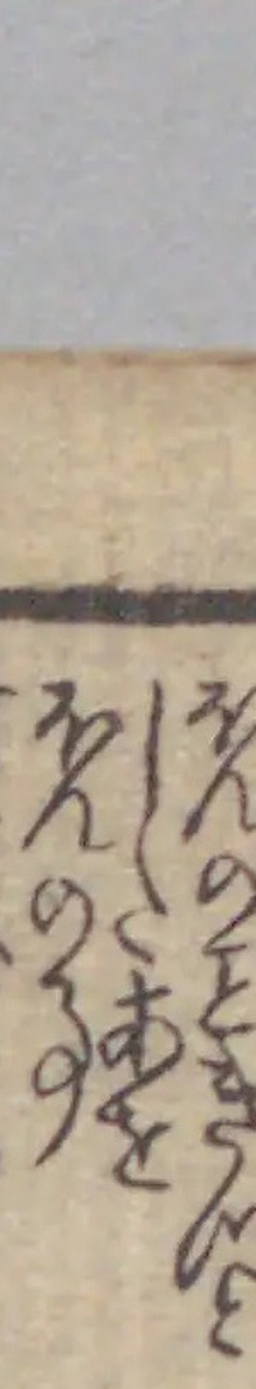ほんの事
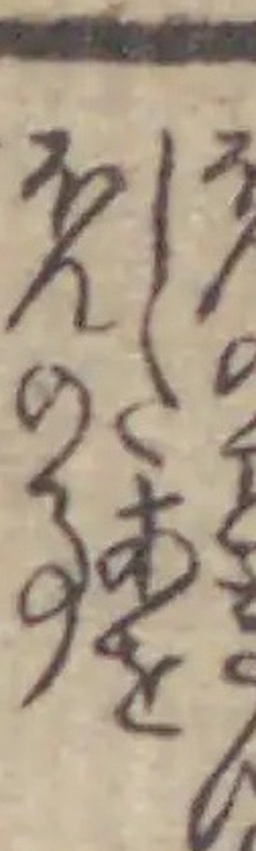ほんの事も
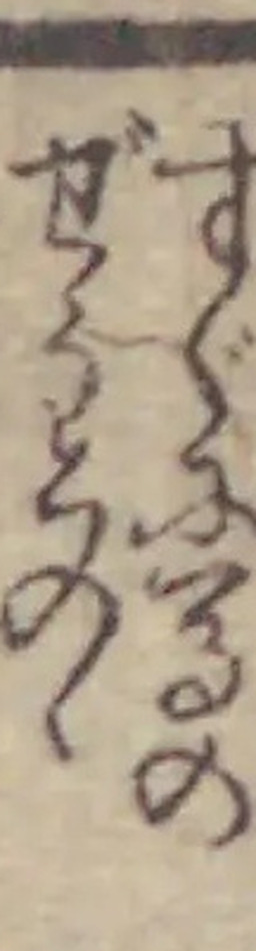ぜうとのゝ
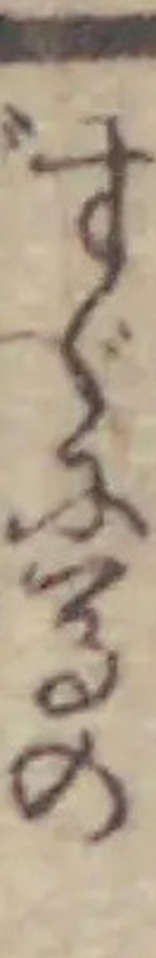すぐに馬の
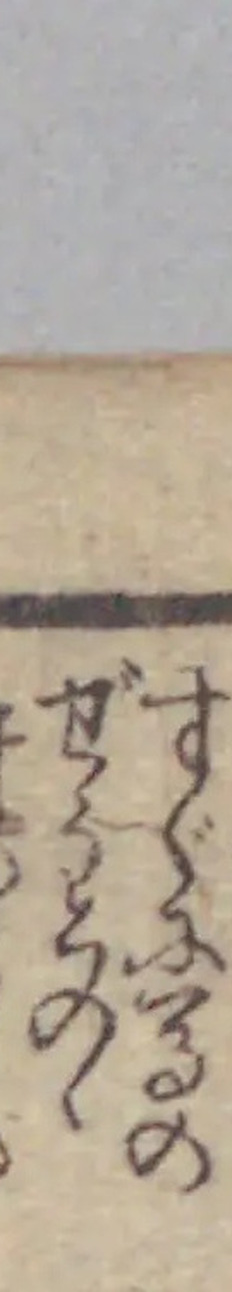ぜうとのゝ
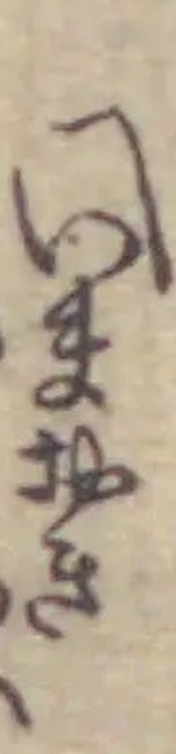〽いまおき
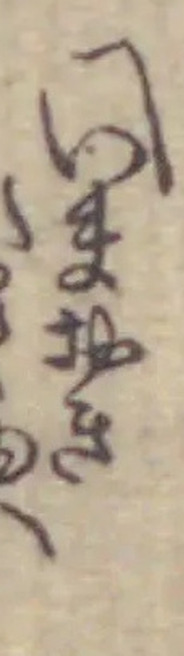〽いまおき
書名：道笑双六
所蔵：国立国会図書館 National Diet Library, JAPAN
